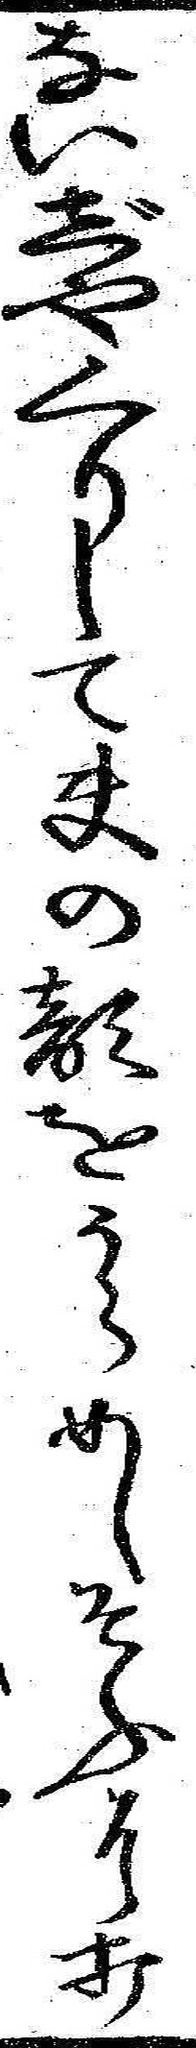ないじやくりして夫の顔をうらめしそふに打
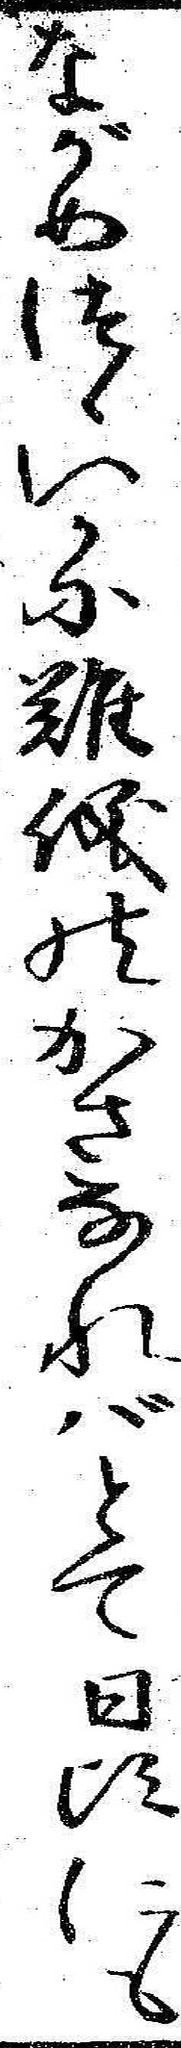ながめつゝいかに難儀のかさなればとて日頃にも
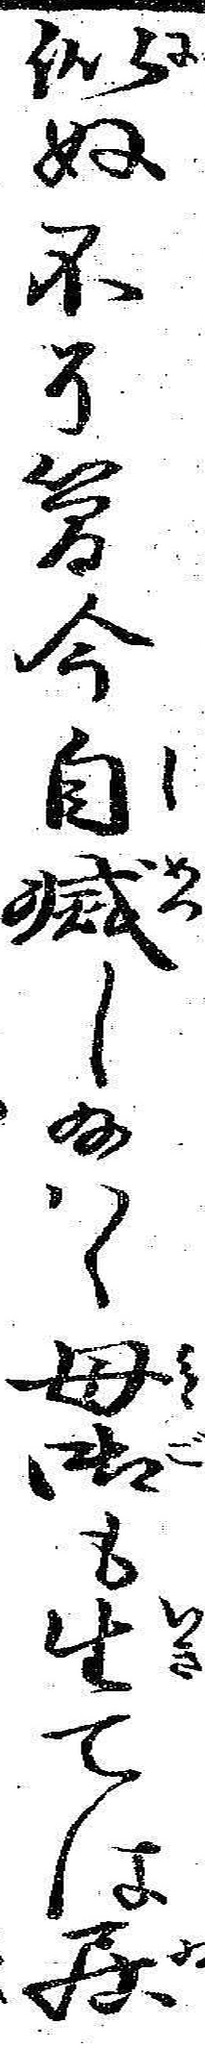似ぬ不了簡今自減し給はゝ母御も生ては居
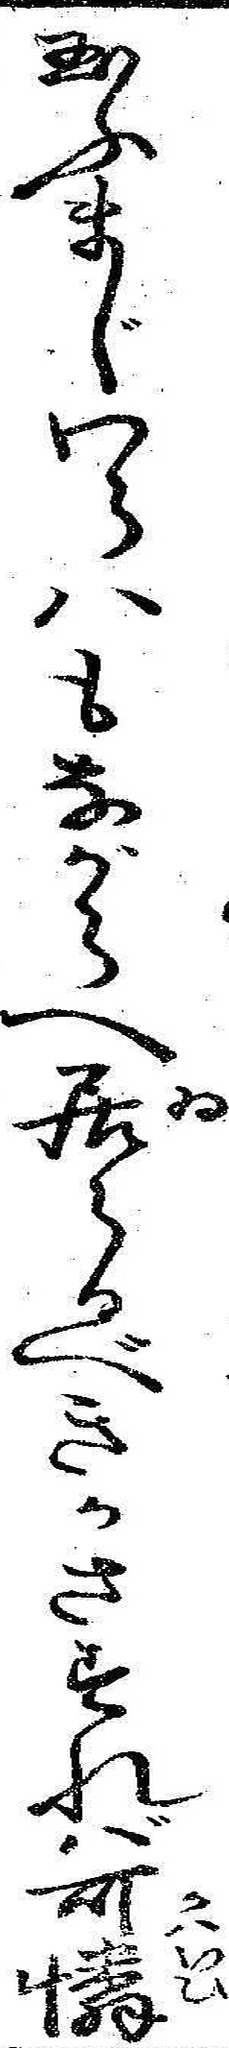玉ふまじわらはもながらへ居らるべきかさすれば可隣
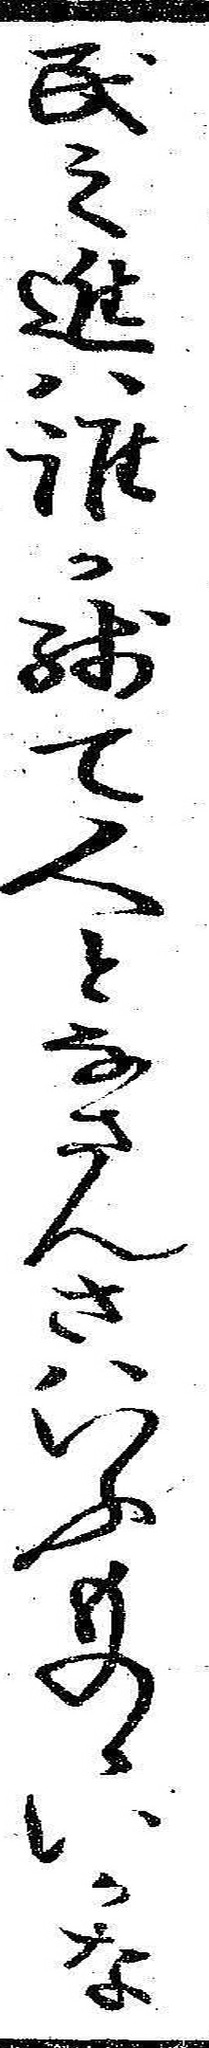民之進は誰か残て人となさんさはいふものゝいかな
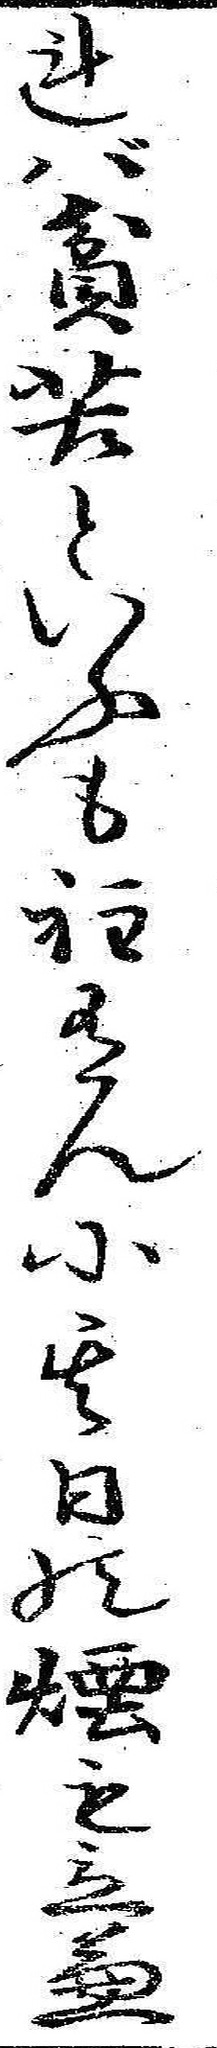れば貧苦といふも程有んに其日の煙も立兼
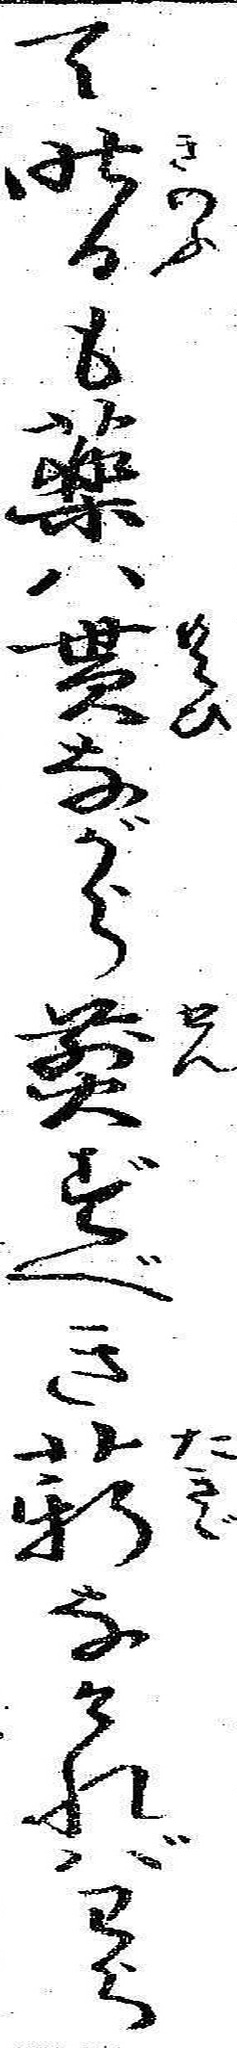て昨日も薬は貰ながら煎ずべき薪なければわら
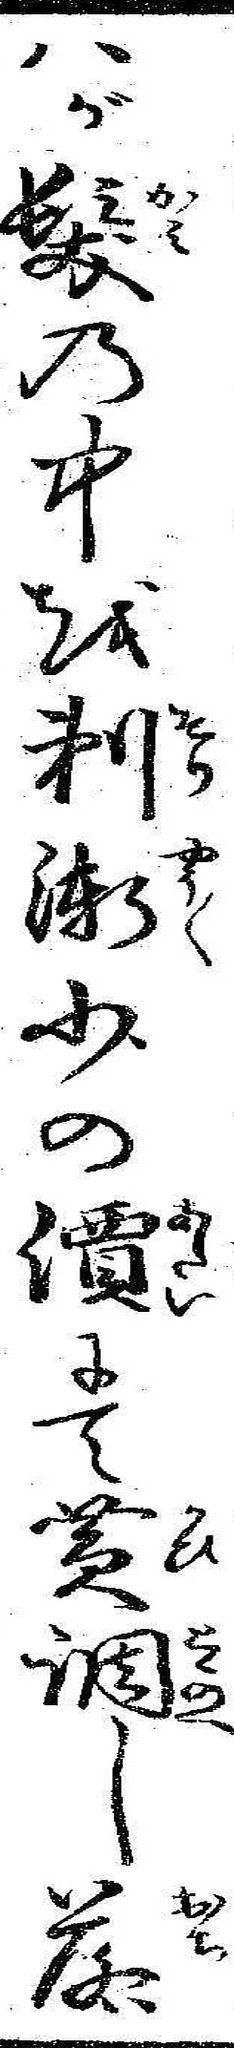はが髪の中を剃漸少の価にて買調し落
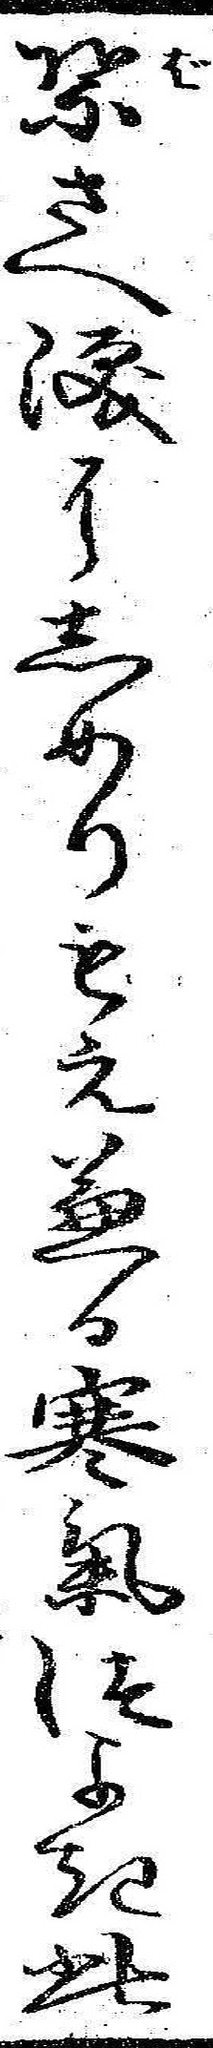葉さへ涙にしめりもえ兼る寒気つよき此
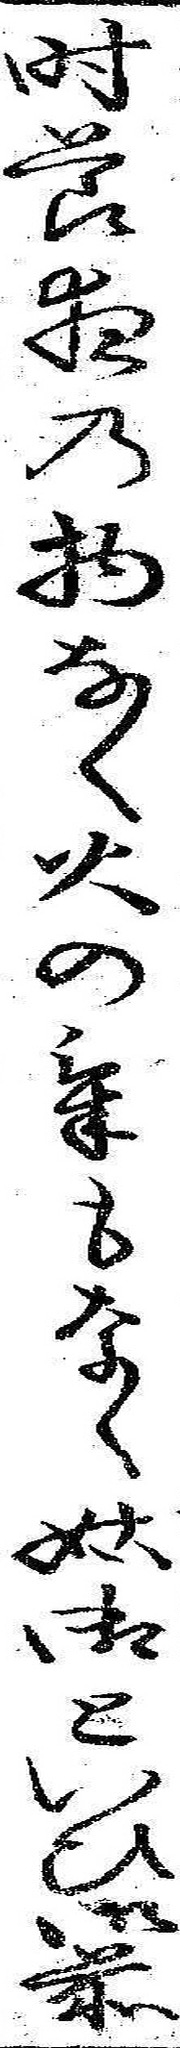時節夜の物なく火の気もなく姑御といひ御前
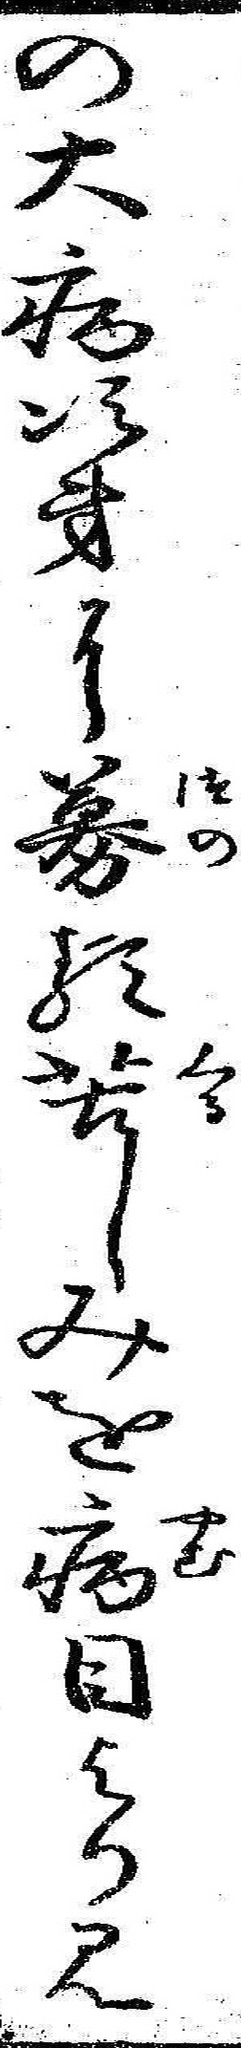の大病次第に暮る苦しみを病目より見
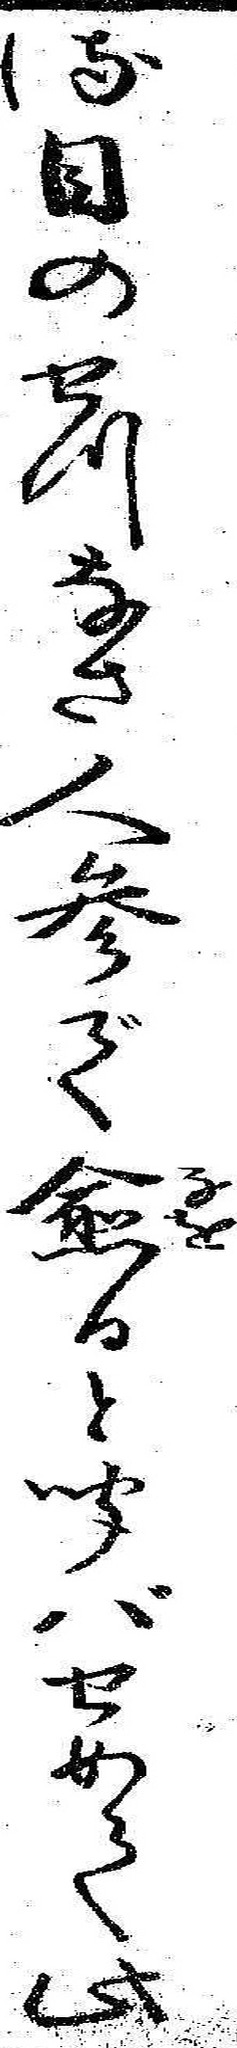る目のせつなさ人参で癒ると聞ばせめて此

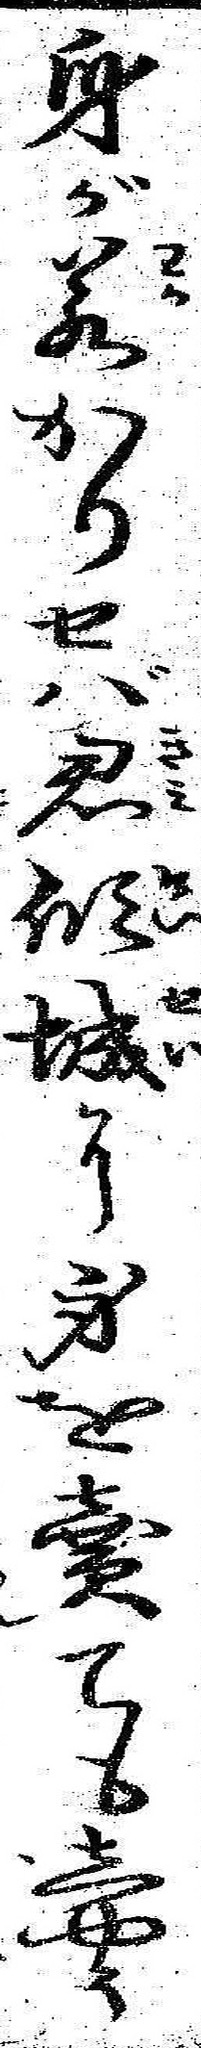身が若かりせば君傾城に身を売てもしやう
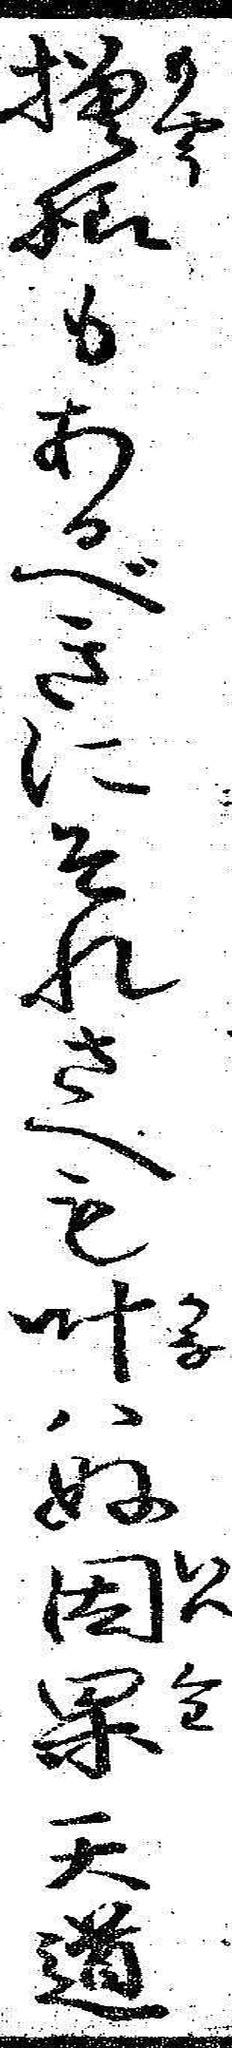模様もあるべきにそれさへも叶はぬ因果天道
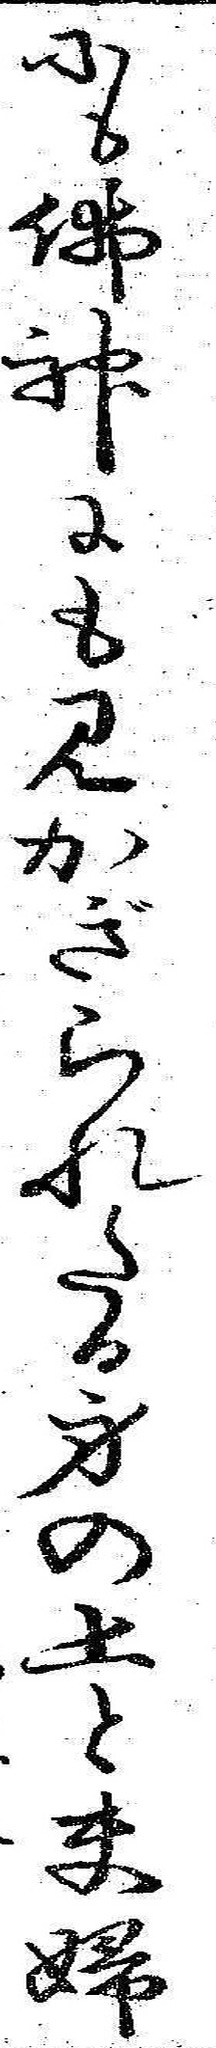にも仏神にも見かぎられたる身の上と夫婦
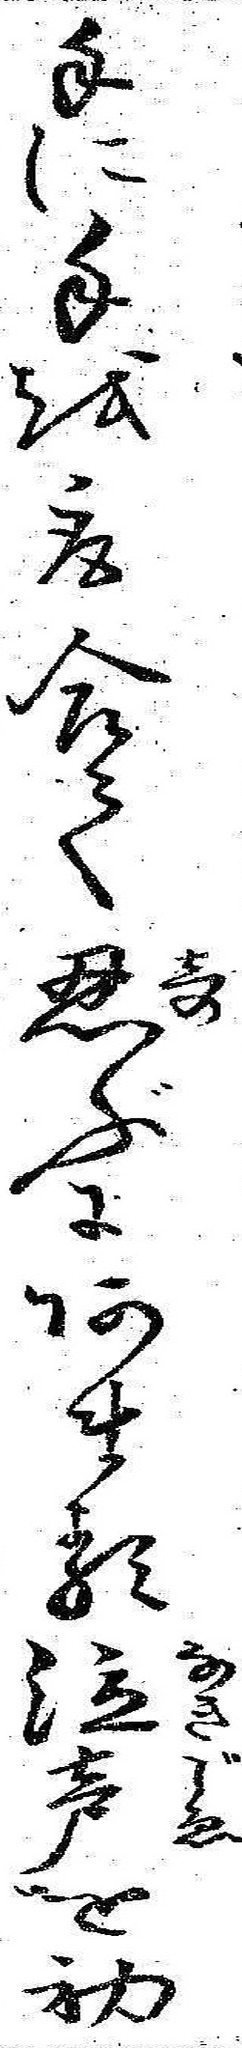手に手を取合て忍ぶにあまる泣声を初
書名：根無草後編
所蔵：国文学研究資料館
